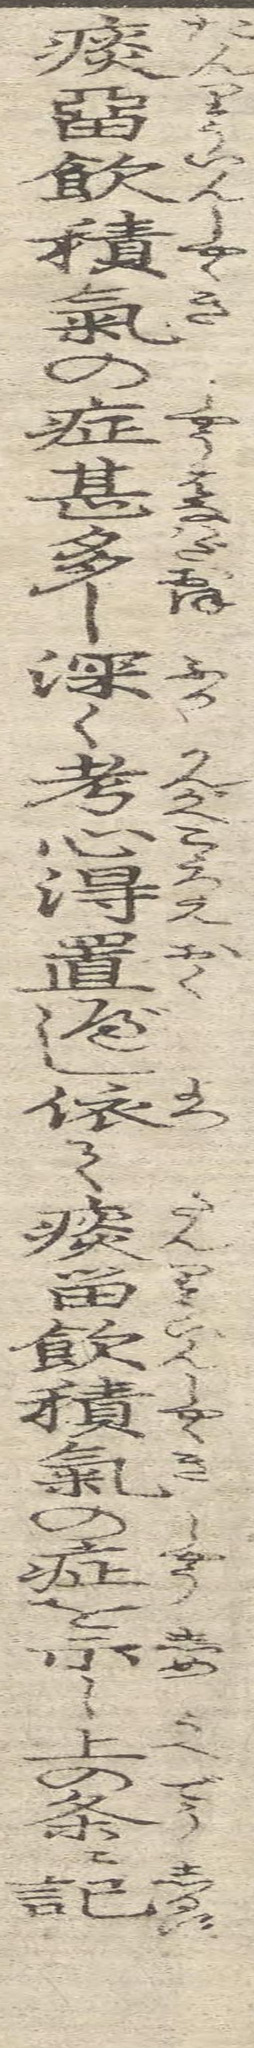痰留飲積気の症甚多し深く考心得置べし依て痰留飲積気の症を示し上の条に記
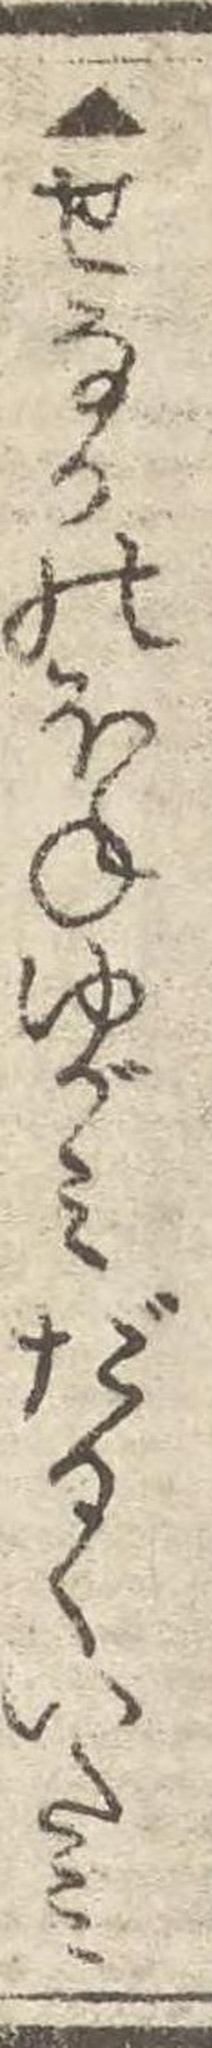▲せなかのほねゆがみだるくいたみ
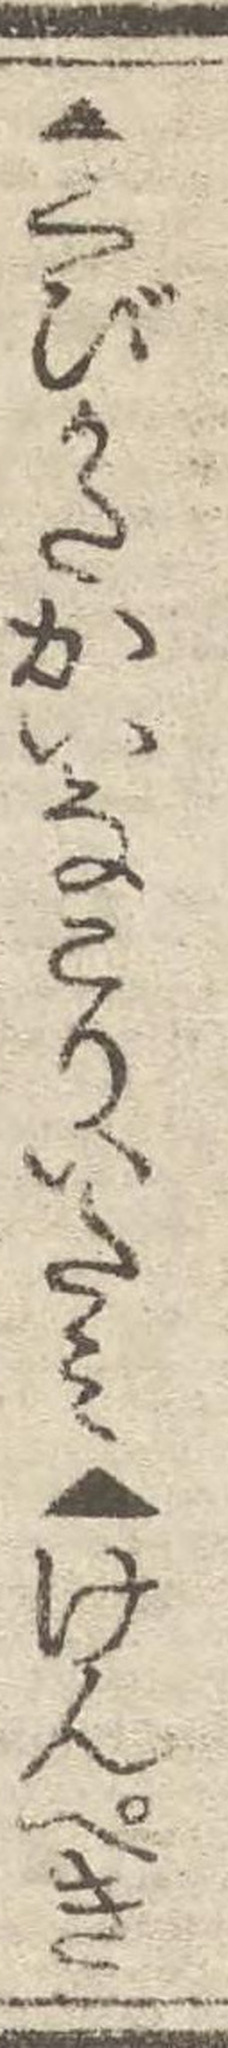▲くびかたかいなこりいたみ▲けんぺき
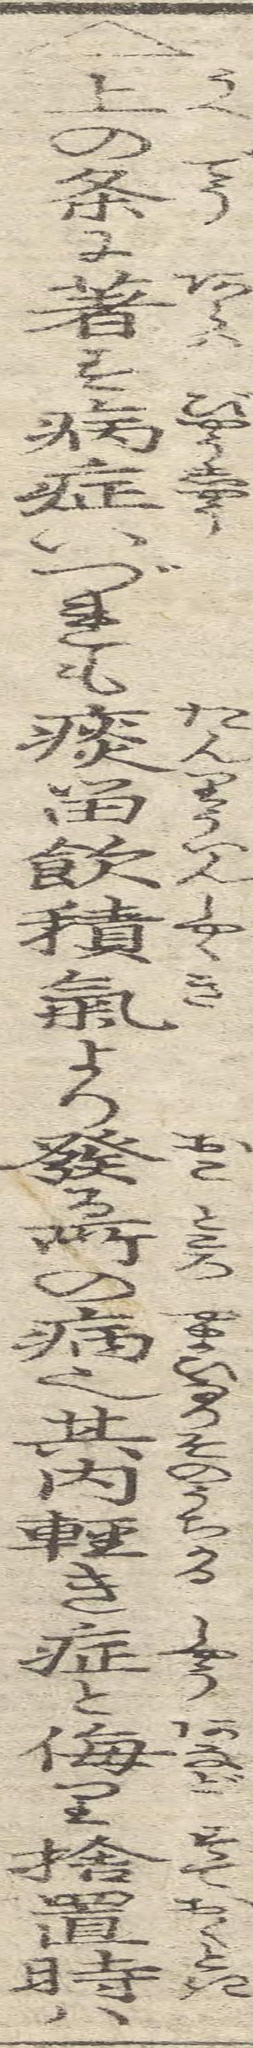△上の条に著す病症いづれも痰留飲積気より発る所の病也其内軽き症と侮り捨置時は
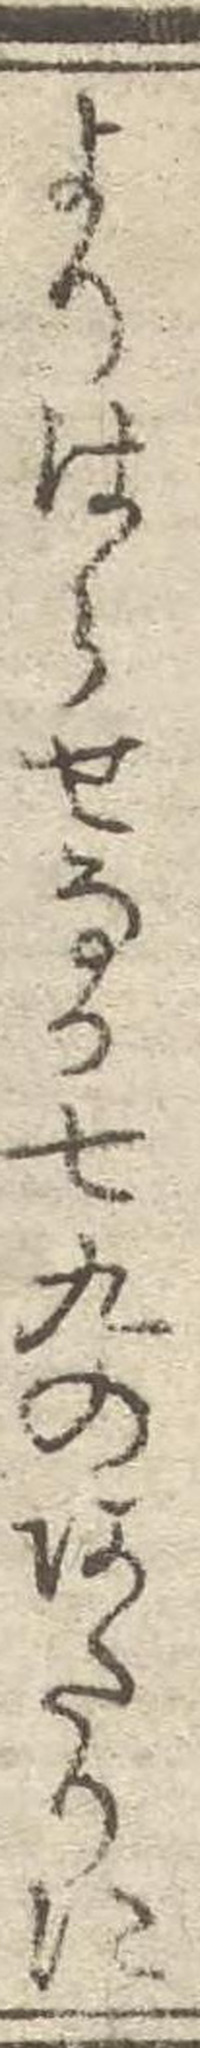よりはらせなか七九のあたりに
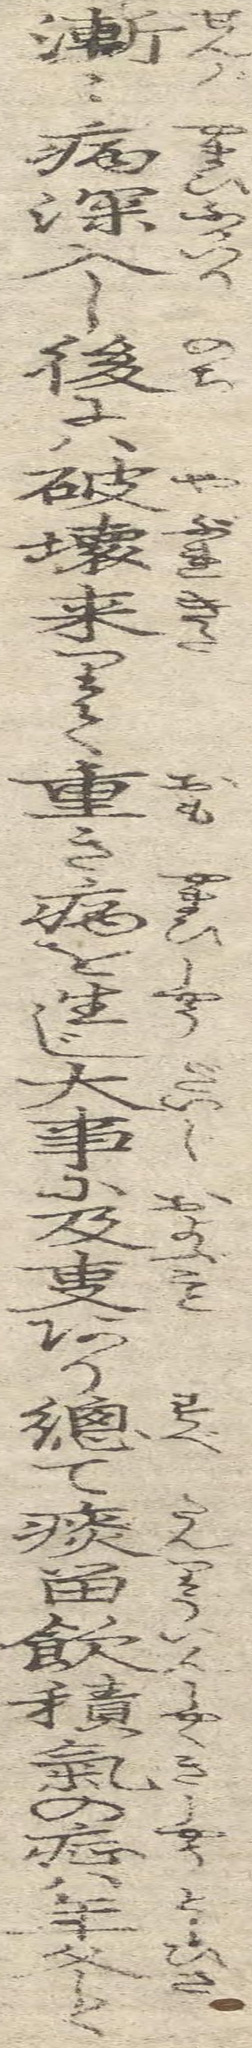漸々病深入し後には破壊来りて重き病を生じ大事に及事あり総て痰留飲積気の症は年久しく
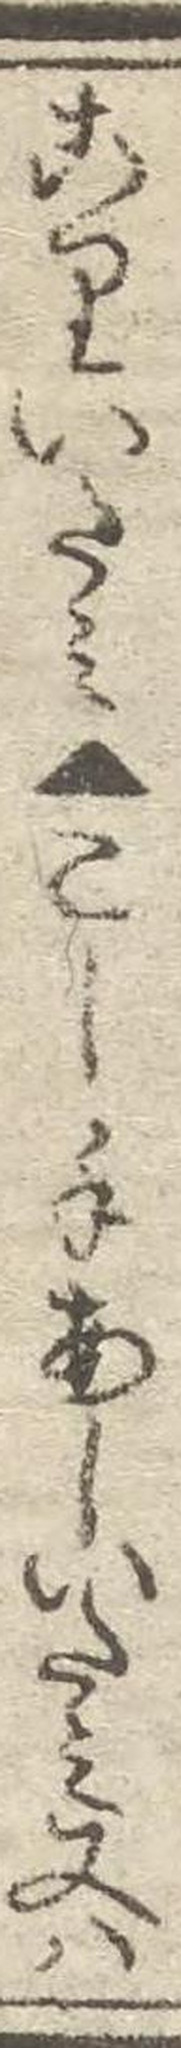こりいたみ▲こし手あしいたみ又は
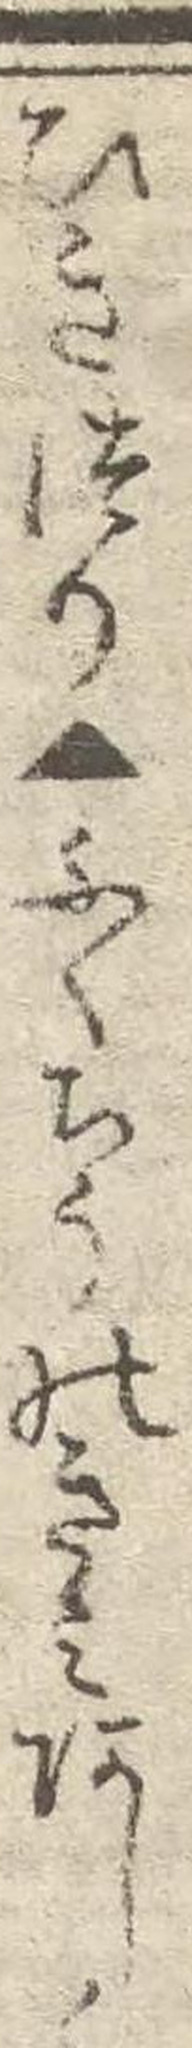ひきつり▲ふくちうのきみあしく
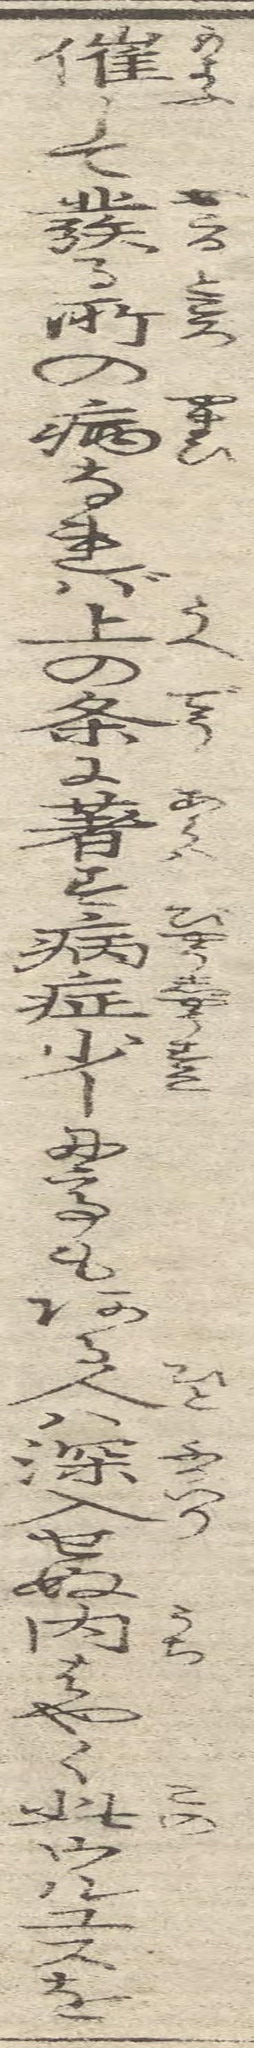催して発所の病なれば上の条に著す病症少しにてもある人は深入せぬ内はやく此ウルユスを
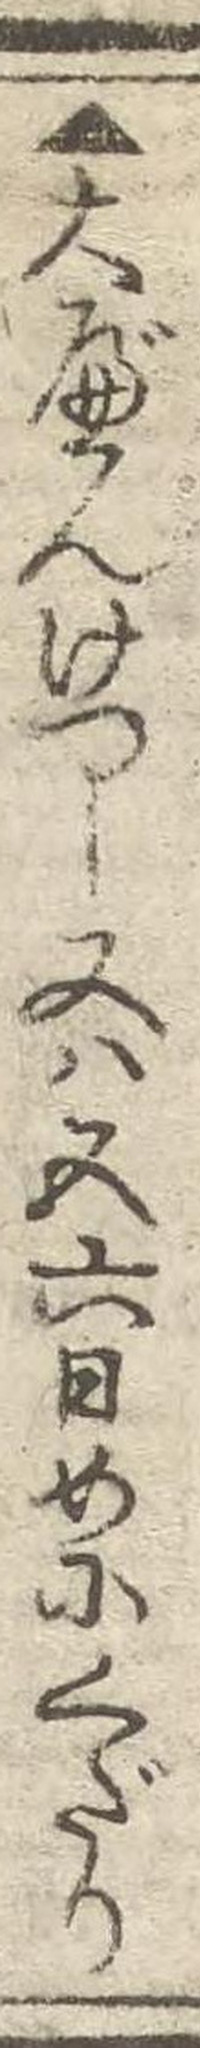▲大べんけつし又は五六日めにくだり
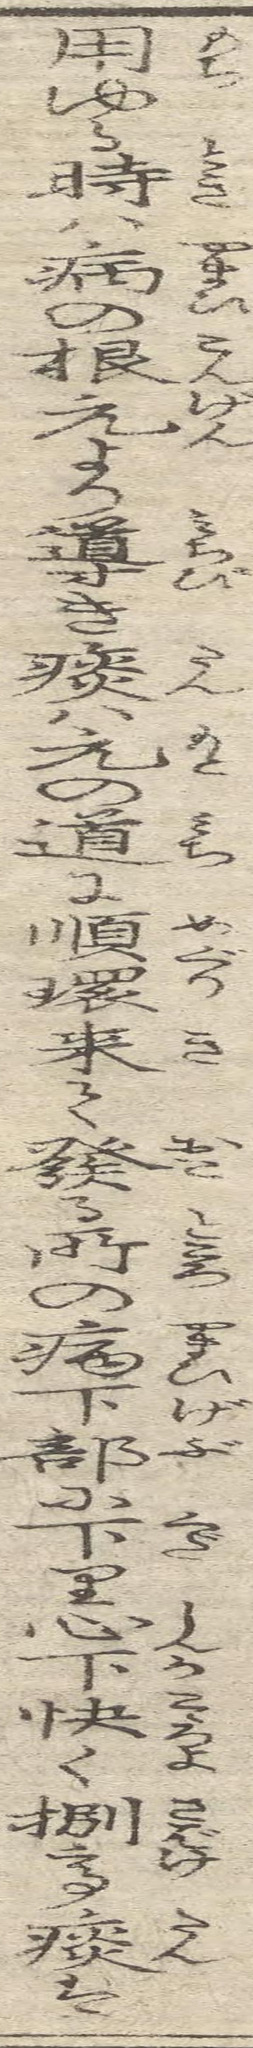用ゆる時は病の根元より導き痰は元の道に順環来て発る所の病下部に下り心下快く捌て痰は
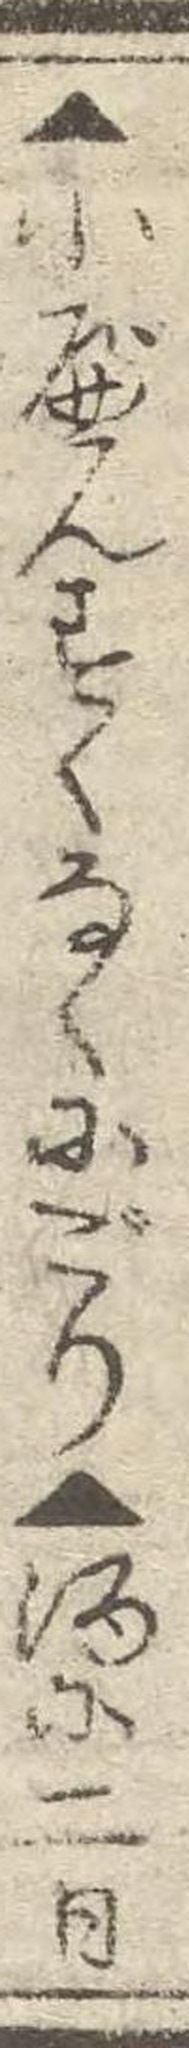▲小べんすくなくにごり▲酒に二日
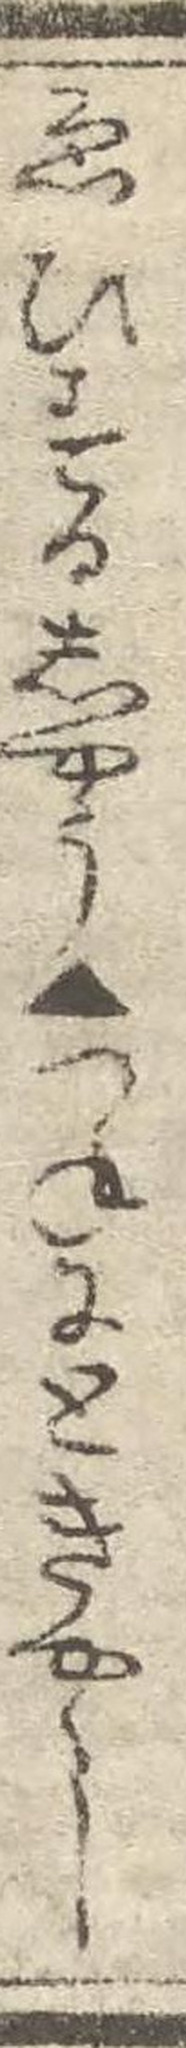ゑひするしやう▲つねにときやくし
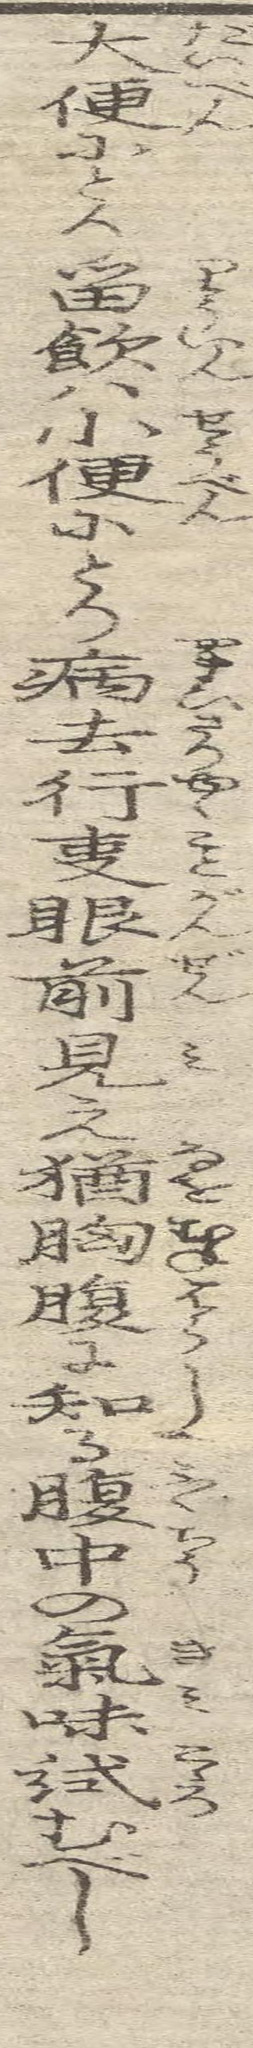大便にとり留飲は小便にとり病去行事眼前見え猶胸腹に知る腹中の気味試むべし
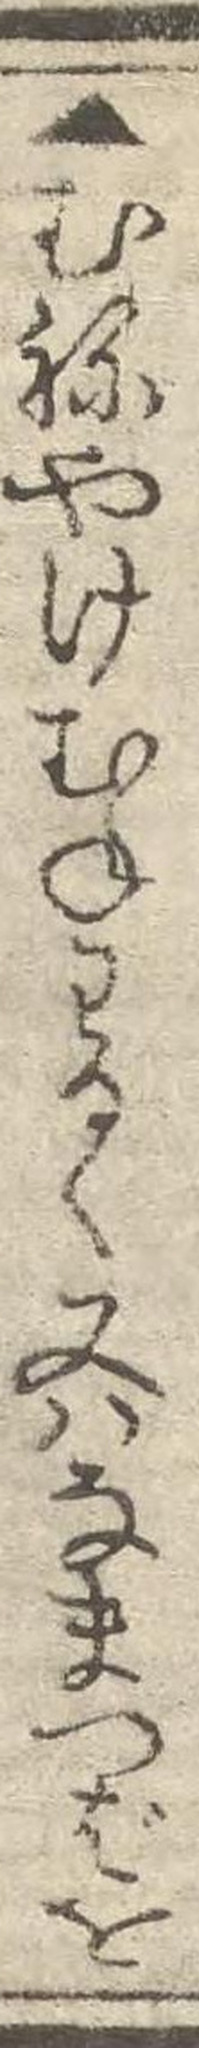▲むねやけむねわるく又はなまつばを
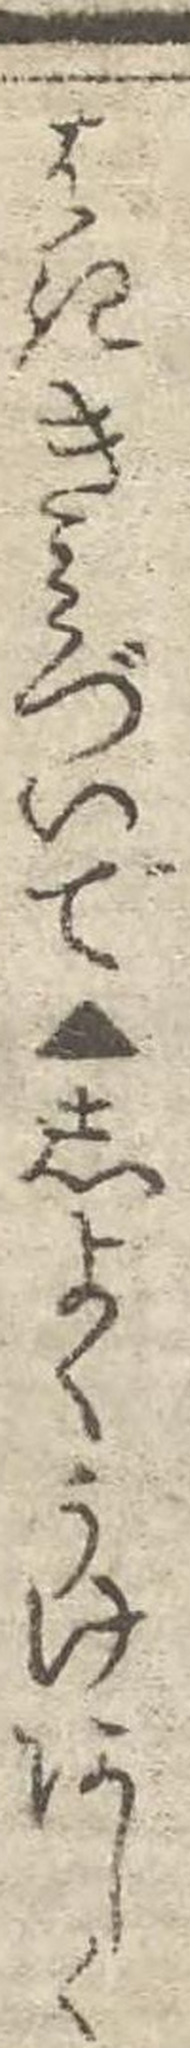はききみづいで▲しよくうけあしく
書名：浪華薬種問屋能書張交帖. 一
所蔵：国立国会図書館 National Diet Library, JAPAN
